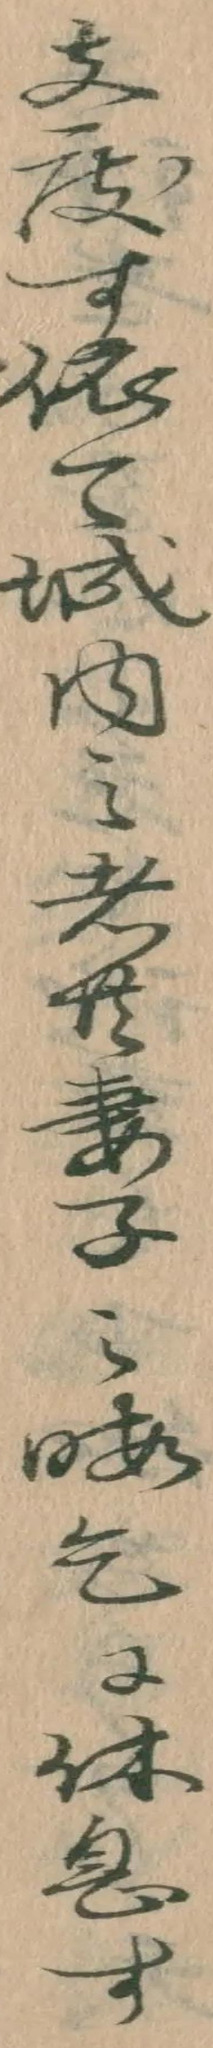仕度す依て城内之者共妻子之暇乞尓休息す
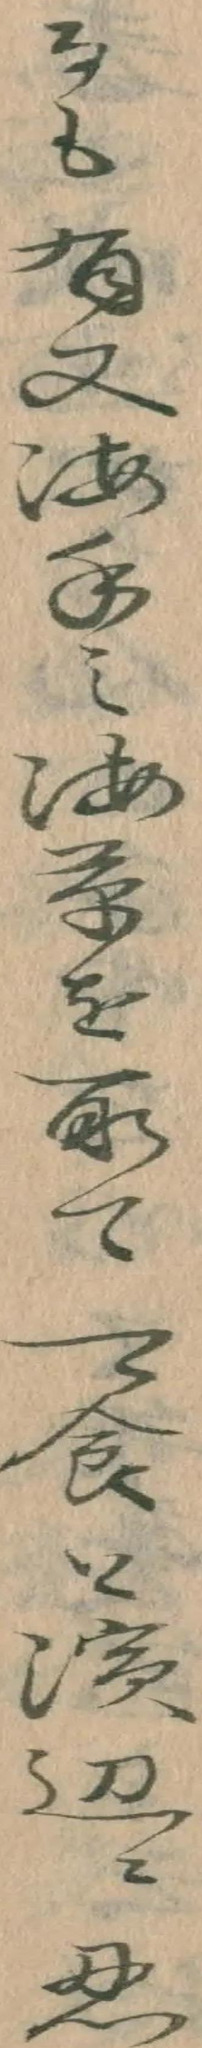るも有又海手之海草を取て可食と浜辺に忍
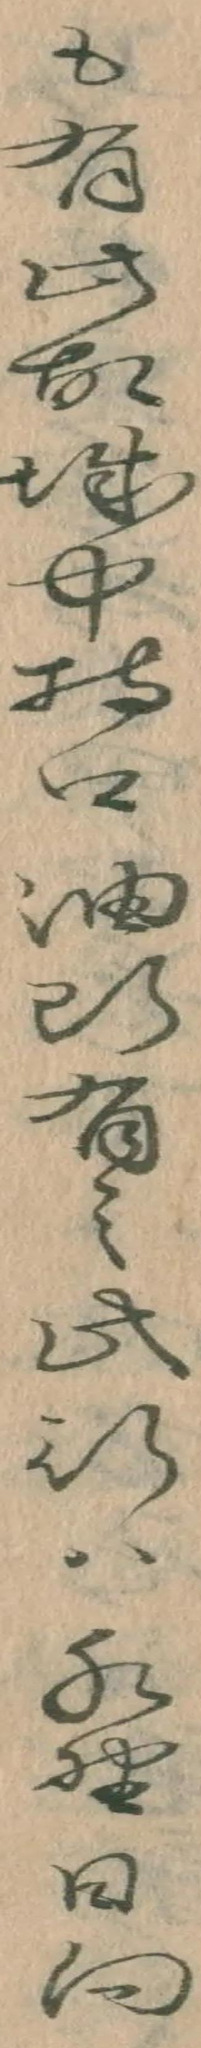も有此故城中持口油断有之此行は水野日向
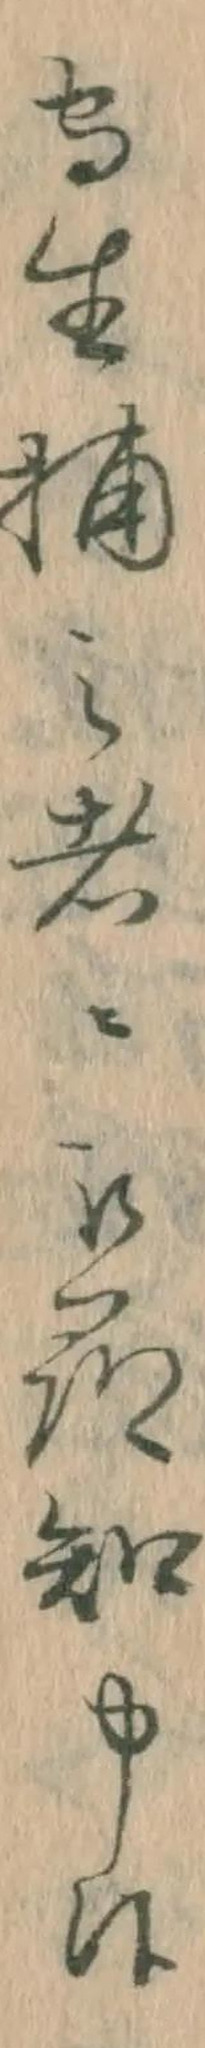守生捕之者に被尋知申候
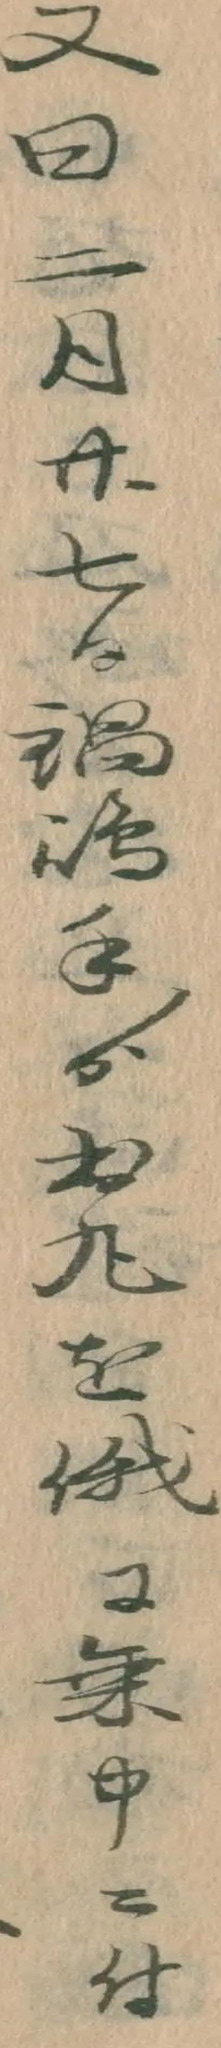又曰二月廿七日鍋島手ゟ出丸を俄尓乗申に付
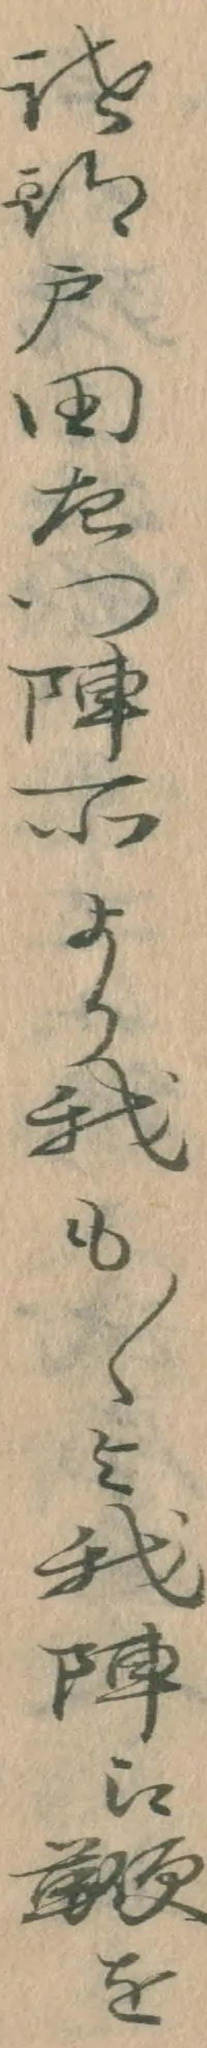諸将戸田左門陣所より我も〱与我陣江鞭を
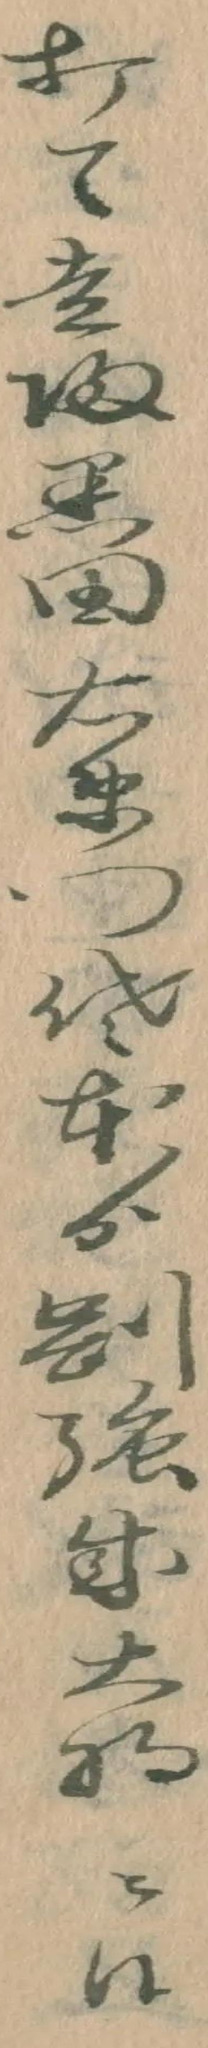打て走帰黒田右衛門佐本ゟ列強成大将に候
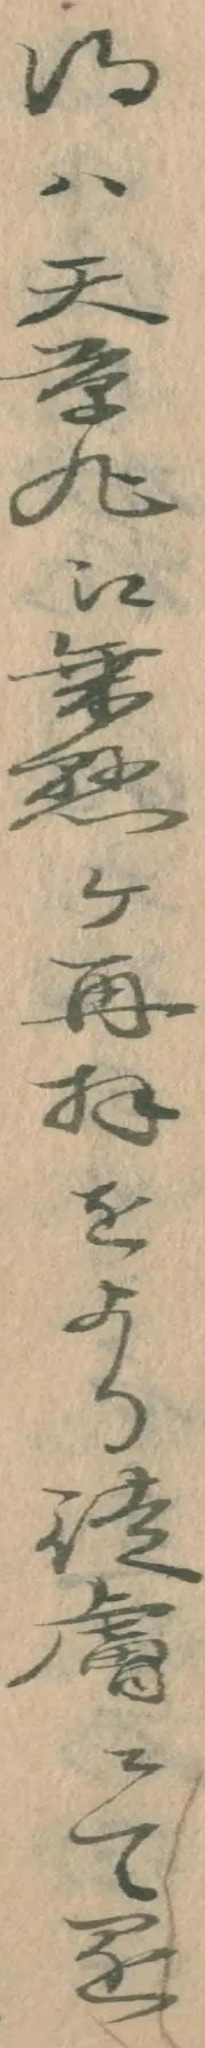得は天草丸江乗懸け再拝をより徒膚にて懸
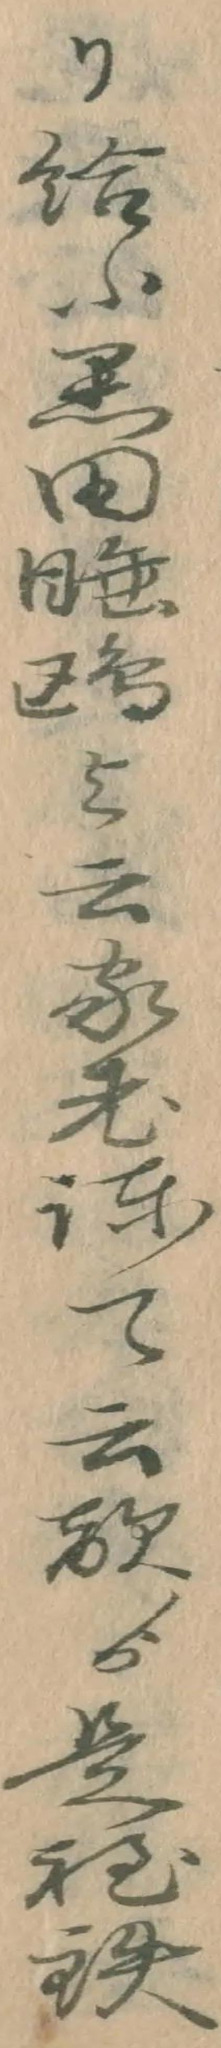り給ふ黒田睡鴎与云家老謀て云敵ゟ是程鉄

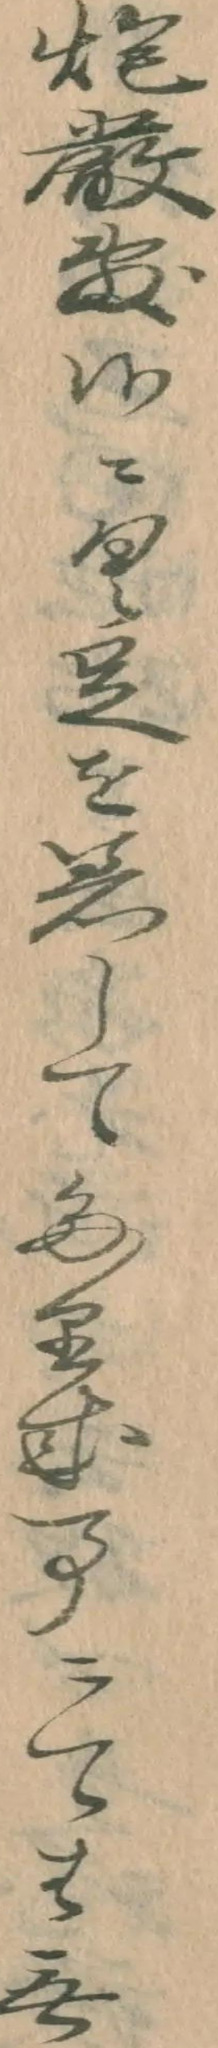炮厳敷候に具足を着して多里成事にて者無
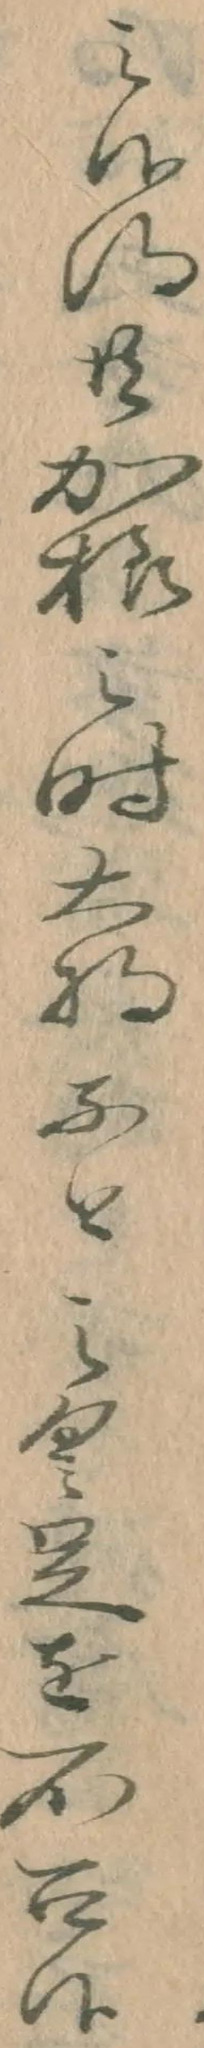之候得共加様之時大将なと之具足を不召候
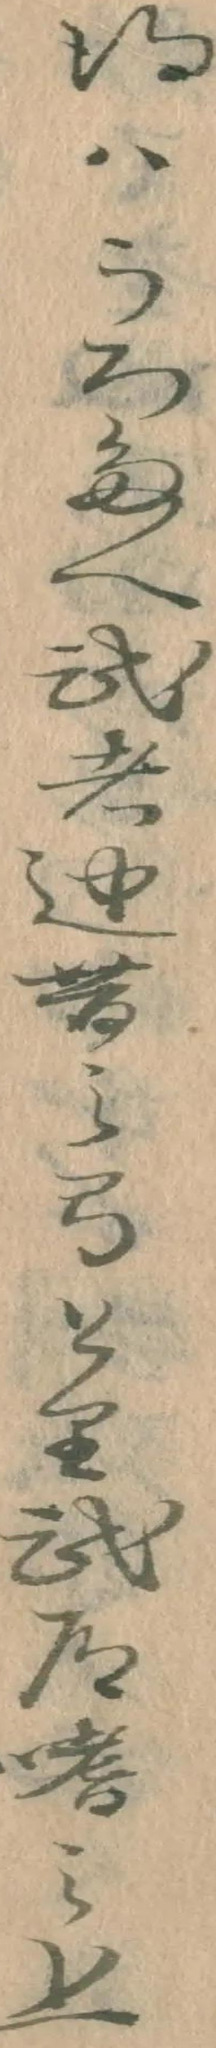得はうろ多へ武者迚昔之弓と里武道嗜之上
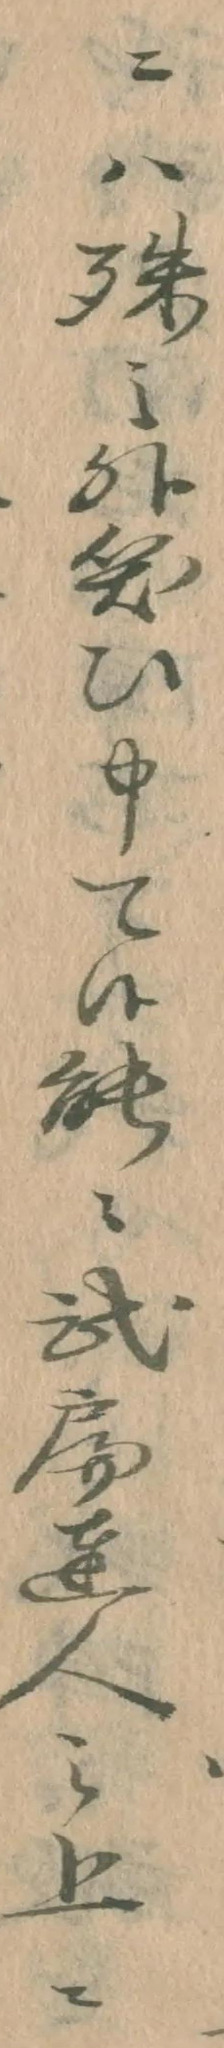には殊之外笑ひ申て候能々武扁達人之上に
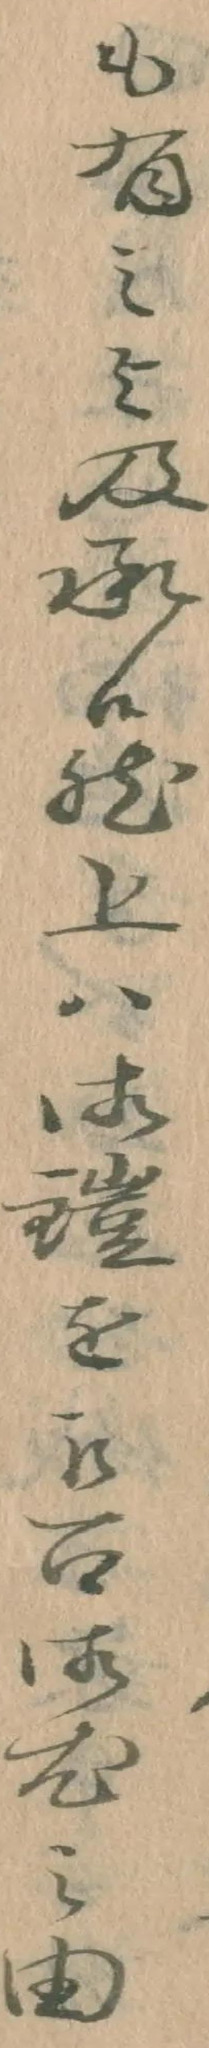も有之与及承候然上は御鎧を被召御尤之由
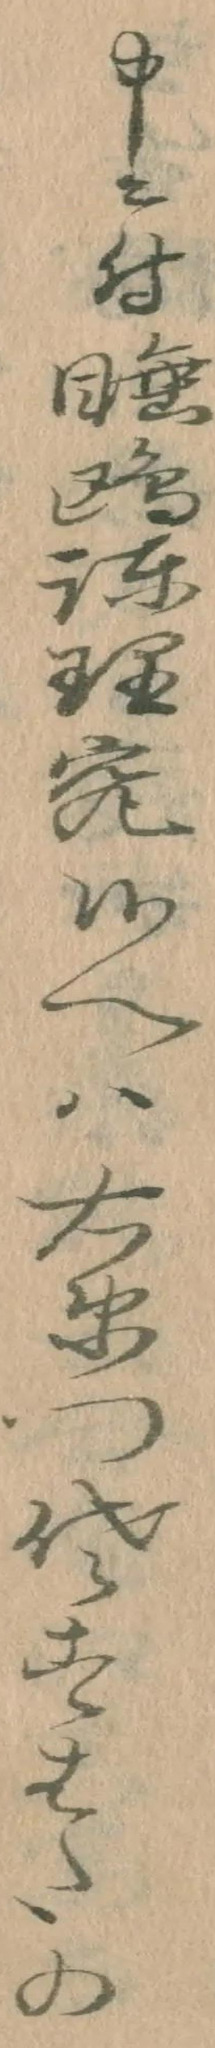申に付睡鴎諫理究候へは右衛門佐春はたの
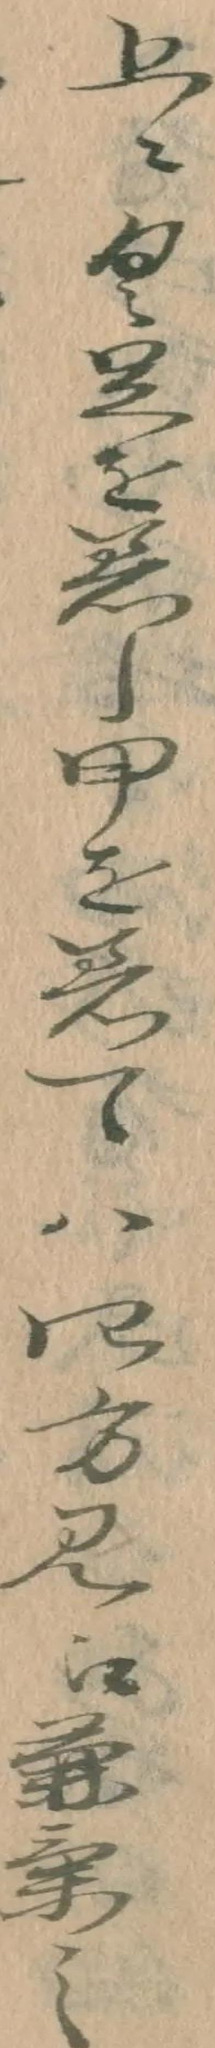上に具足を着し甲を着ては四方見江兼気之
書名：切支丹御退治記 49巻. [7]
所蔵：国立国会図書館 National Diet Library, JAPAN
